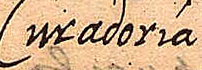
Curadoria
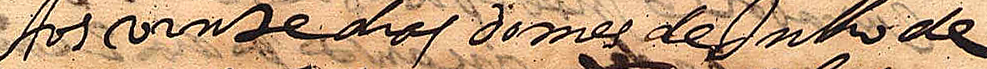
Aos vinte dias do mes de Julho de
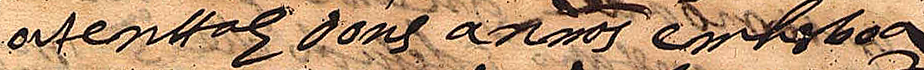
oitentta E dous annos em lisboa
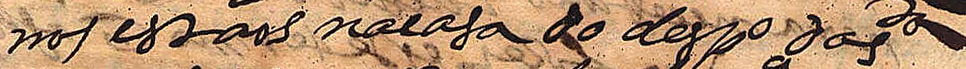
nos estaos na casa do despo da sta
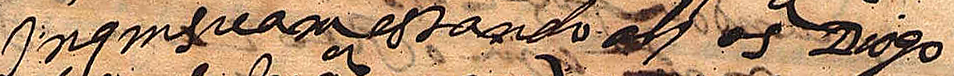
Jnquisiçam estando alj o sor Diogo
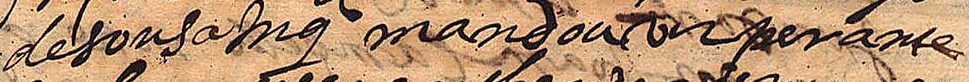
de sousa Inqor mandou vir perante
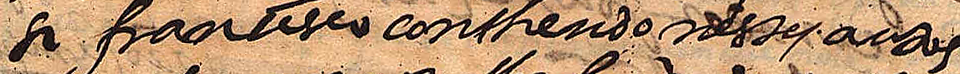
si francisco contheudo neste autos
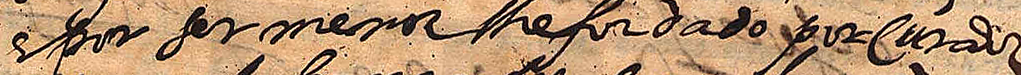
E por ser menor lhe foi dado por Curador
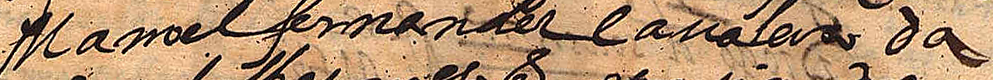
Manoel fernandez caualeiro da
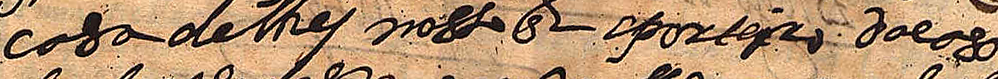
casa dell rej nosso sor E portejro da casa
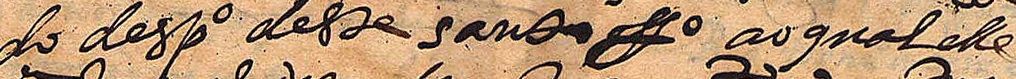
do despo deste santo offo ao qual elle
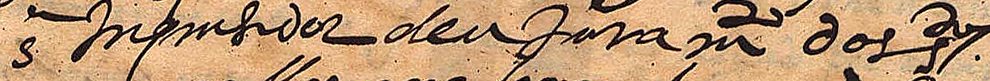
sor Inquisidor deu Juramto dos stos
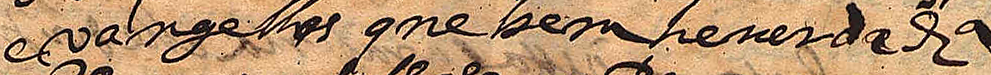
evangelhos que bem he uerdadra
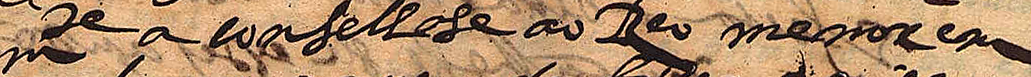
mte aconsellase ao Reo menor em
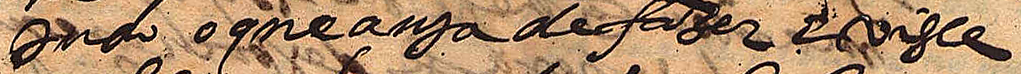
tudo o que auja de fazer e visse
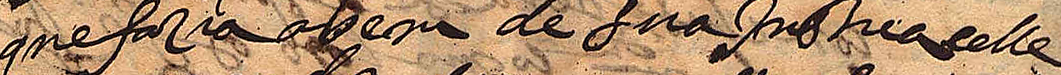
que fazia a bem de sua Justiça e elle
